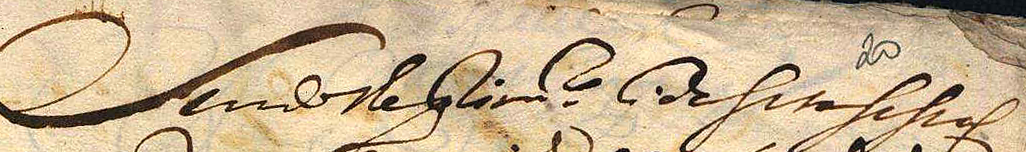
Sendolhe pRim.Ro lida sua sessaõ
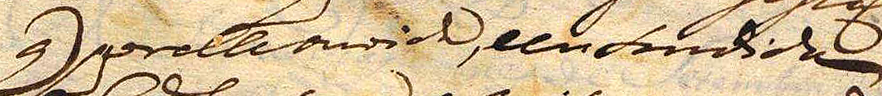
q̄ por elle ouvida, e entendida
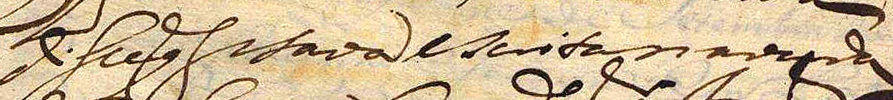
disse q̄ estava escrita na verda
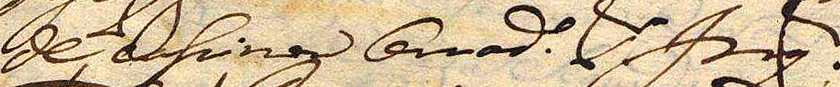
de, assinou Com o d.o sor Jnq.or
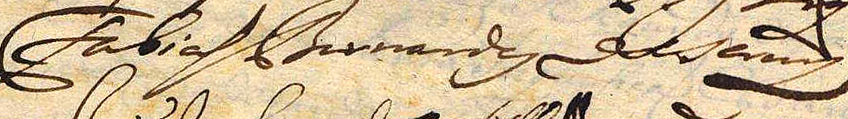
Fabiaꝭ Bernardes o escreuj
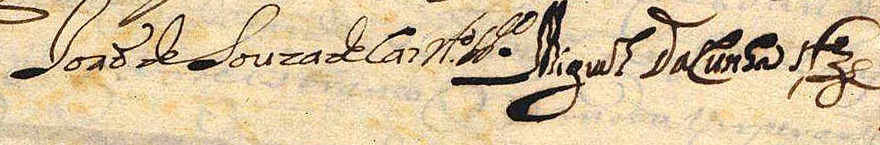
Ioaõ de Souza de Cast.o br.co Miguel da Cunha
